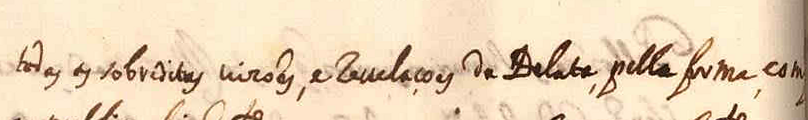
todas as sobreditas uizoẽs, e Reuelaçoes da Delata, pella forma, com
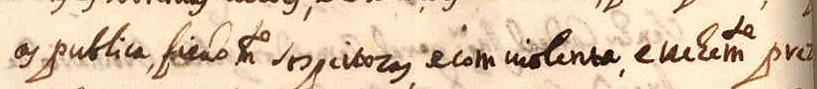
as publica, ficaõ mto sospeitozas, e com violenta, e uehemte prez
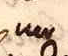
uer
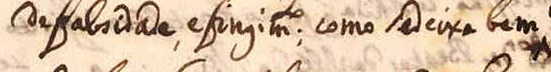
de falsidade, e fingim.to como se deixa bem
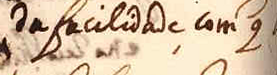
da facilidade com q̄
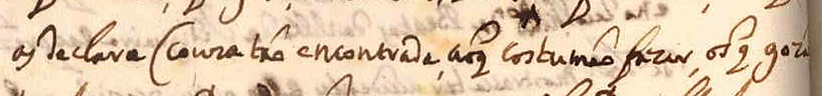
as declara (couza taõ encontrada, ao q̄ costumaõ fazer, os q̄ goza
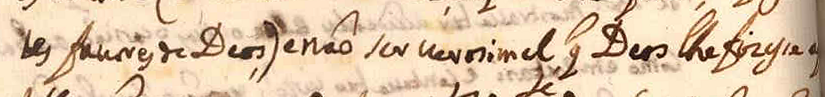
tes fauores de Deos,) e naõ ser uerosimel, q̄ Deos lhe fizesse a
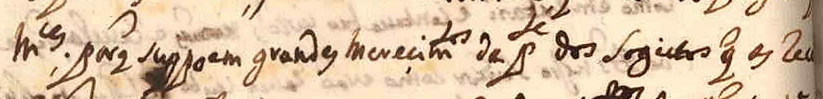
M.ces, porq̄ suppoem grandes merecimtos de pte dos sogeitos q̄ os Rec
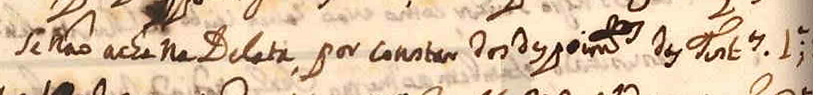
se naõ acha na Delata, por constar dos despoimtos das Testas. 1.a
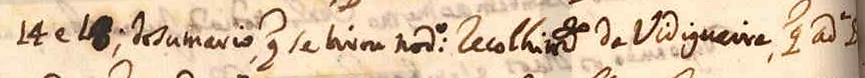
14 e 18; do sumario, q̄ se tirou no d.o Recolhimto da Vidigueira, q̄ a da D
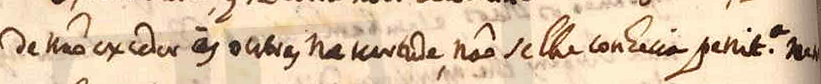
de naõ exceder às outras na uertude, naõ se lhe conhecia penit.a ne
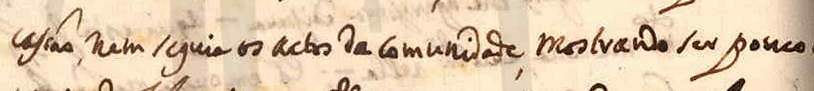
cassaõ, nem seguia os actos da comunidade, mostrando ser pouco
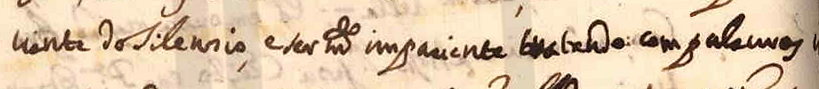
uante do Silensio, e ser mto impaciente tratando com palauras
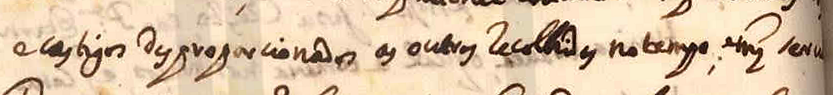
e castigos desproporcionados as outras Recolhidas no tempo; em q̄ seru
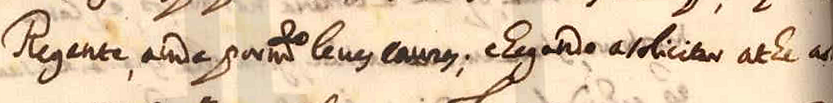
Regente, ainda por mto leues cauzas, chegando a solicitar athe ao
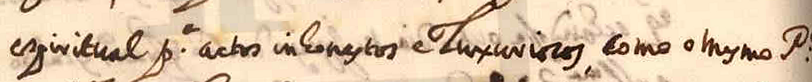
espiritual p.a actos inhonestos e Luxuriozos, como o mesmo P.e
